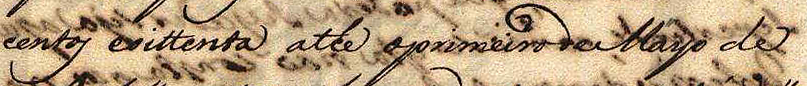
centos e oittenta athe o primeiro de Mayo de
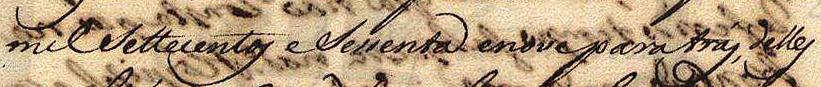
mil settecentos e Sessenta e nove para tras delles
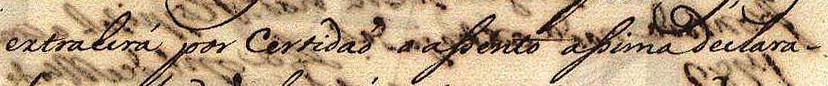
extrahirá por certidaõ o assento assima declara
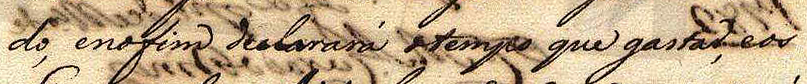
do, e no fim declarará o tempo que gastar, e os
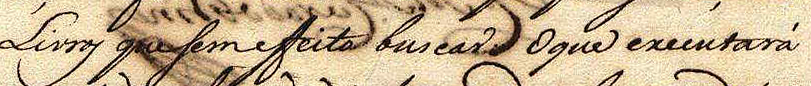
Livros que sem effeito buscar O que executará
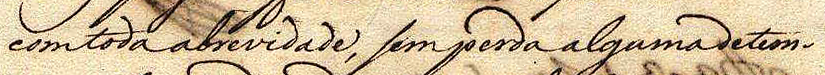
com toda a brevidade, sem perda alguma de tem
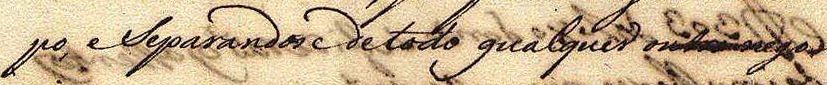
po, e separandose de todo qualquer outro nego
